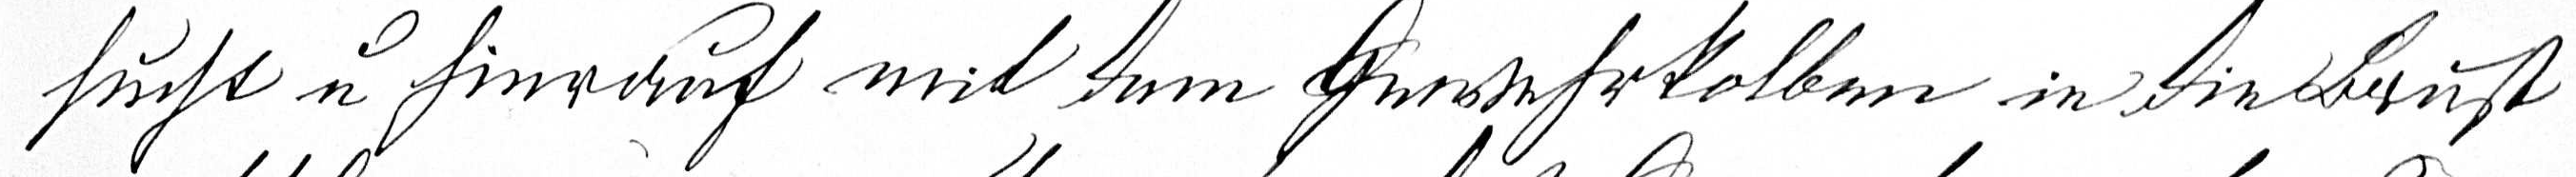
sucht u hierauf mit dem Gewehrkolben in die Brust
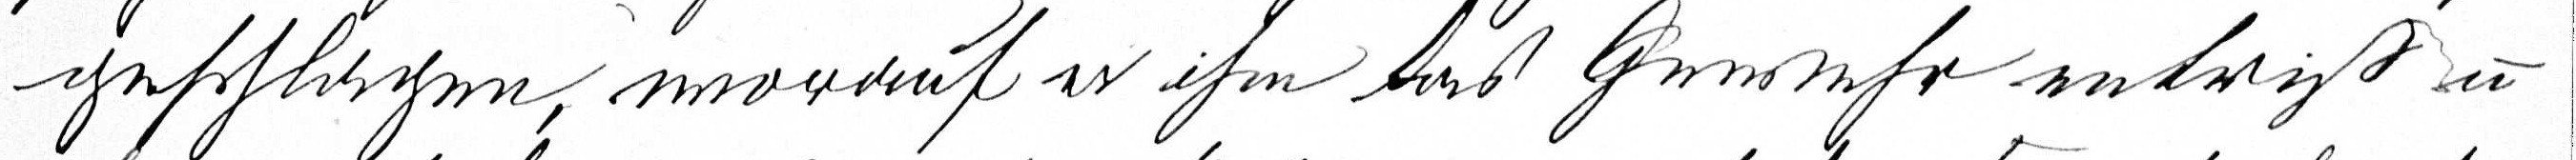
geschlagen, worauf er ihm das Gewehr entriß u
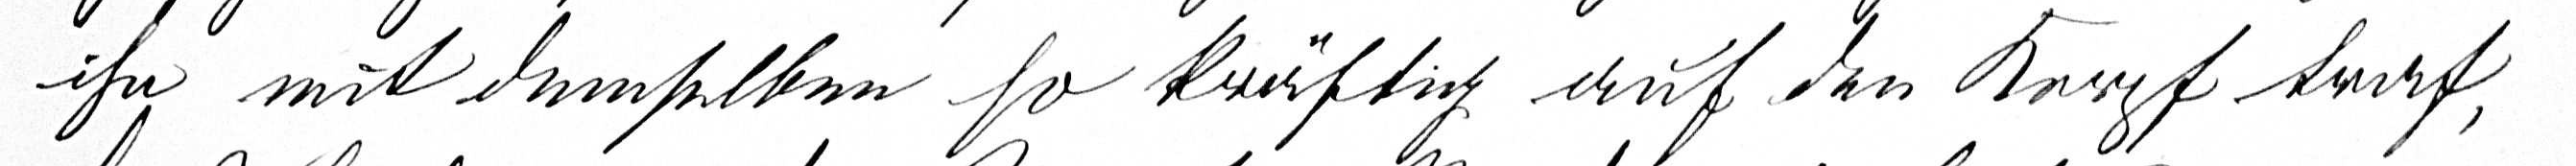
ihn mit demselben so kräftig auf den Kerzf traf,
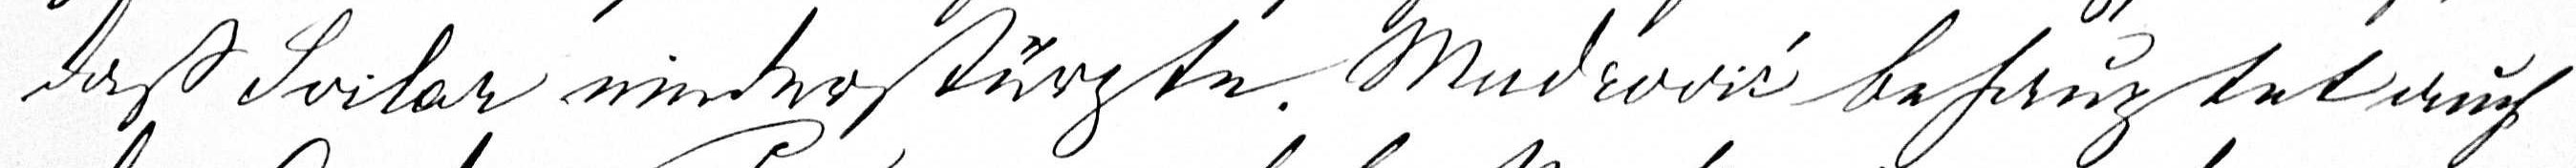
daß Svilar niederstürzte. Novković behauptetauch
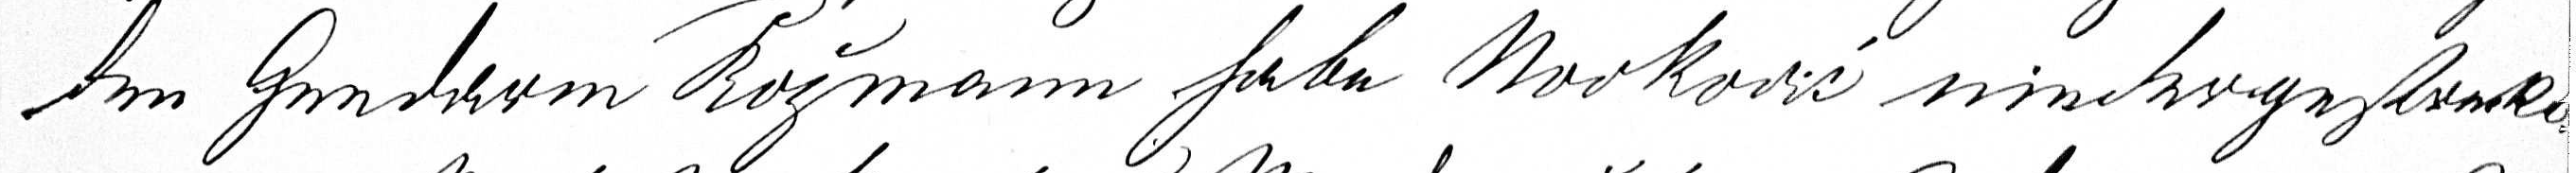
den Gendarm Rozmann habe Novković niedergestreckt.
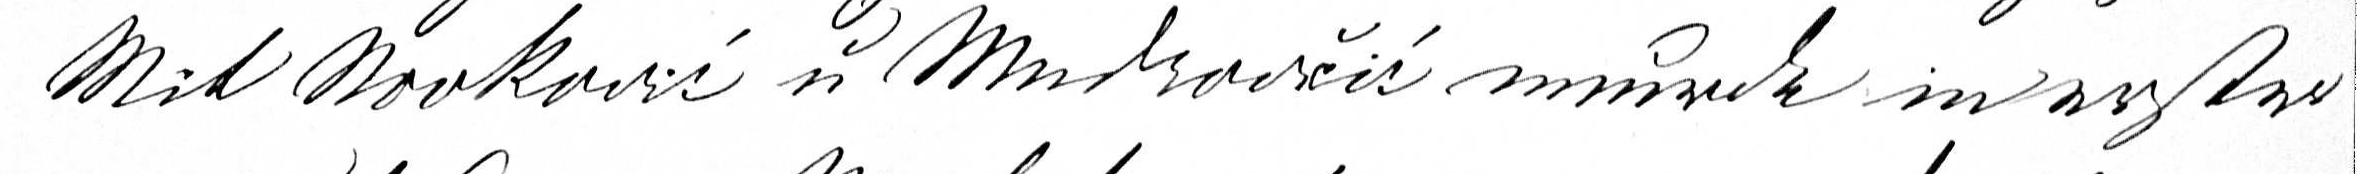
Mit Novković u Mudrovčić wurde in erster
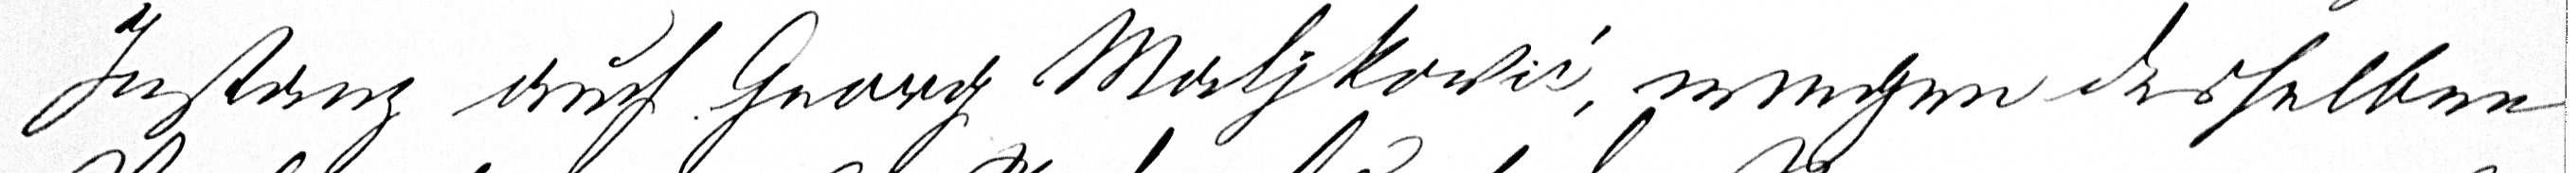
Jnstanz auch Georg Maljković, wegen desselben
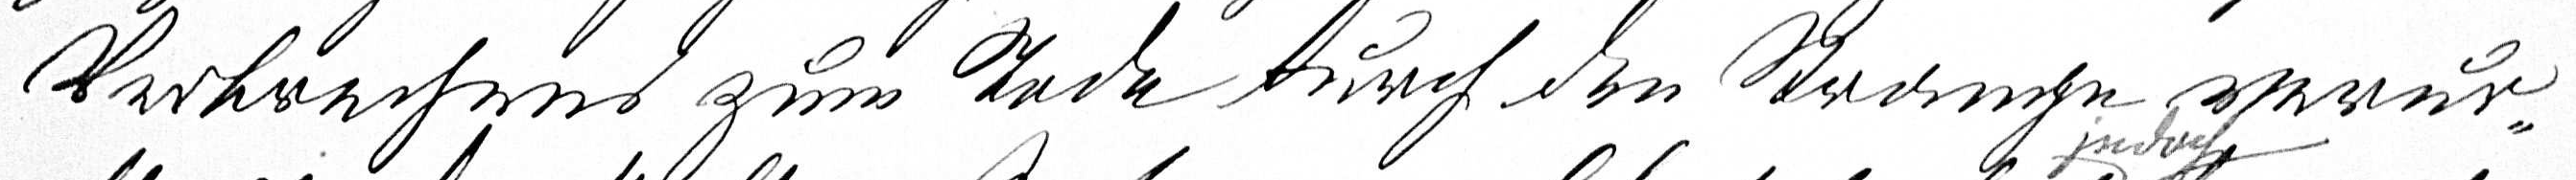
Verbrechens zum Tode durch den Strange verur¬
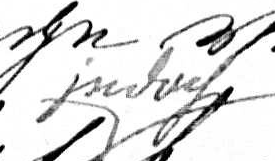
jedoch
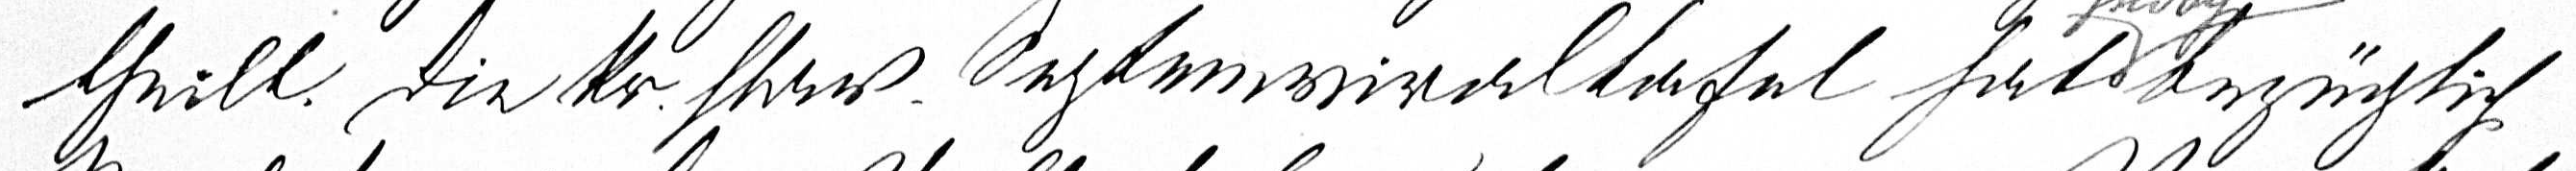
theilt. Die kr. slav. Septemviraltafel hat anzüglich
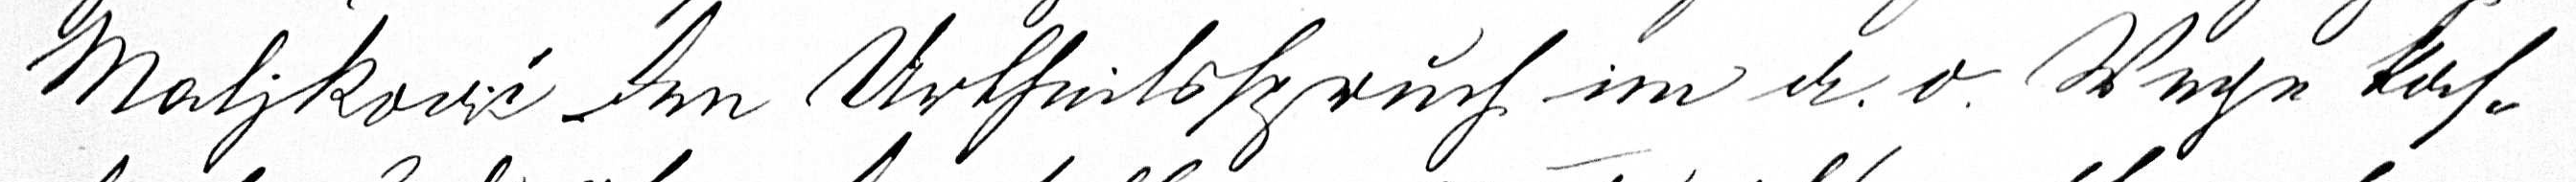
Maljković den Urtheilsspruch im a. o. Wege kas¬
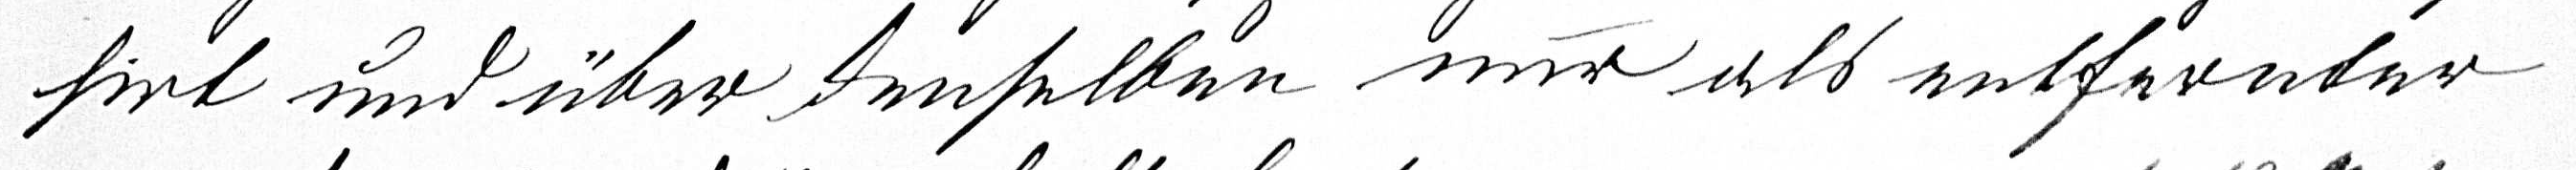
sirt und über denselben mir als entfernter
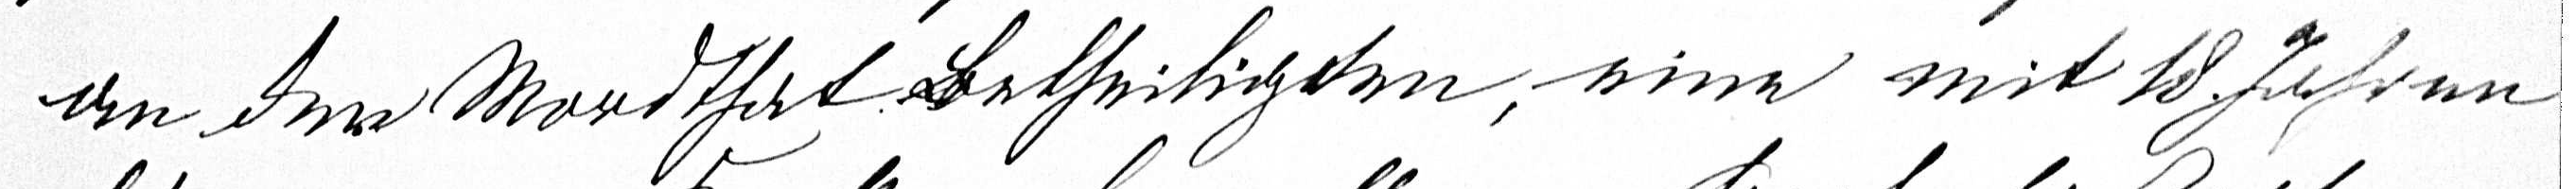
an der Mordthat Betheiligten, eine mit 18. Jahren
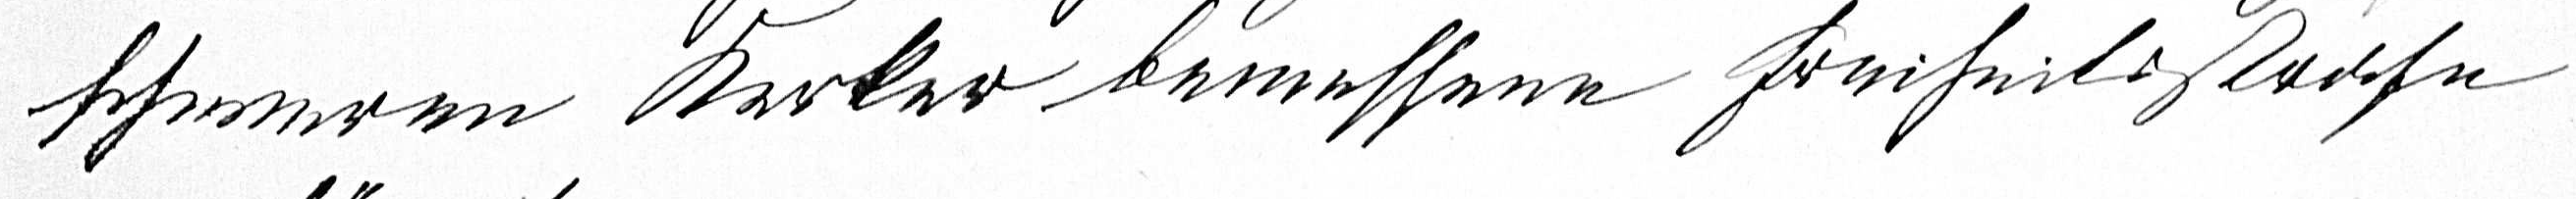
schweren Kerker bemessene Freiheitssstrafe
